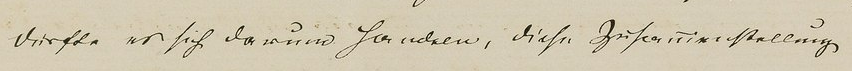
dürfte es sich darum handeln, diese Zusammenstellung
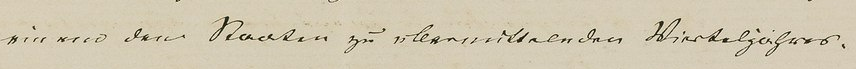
einem den Staaten zu übermittelnden Vierteljahres-
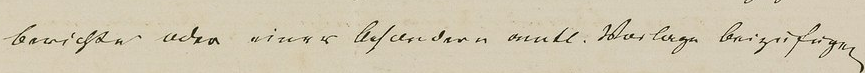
berichte oder einer besondern amtl. Vorlage beizufügen. –
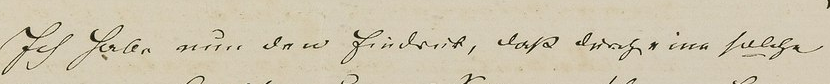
Ich habe nun den Eindruk, daß durch eine solche
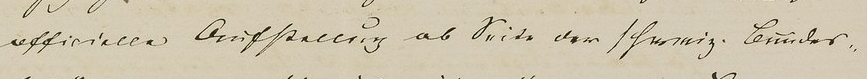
officielle Aufstellung ab Seite der schweiz. Bundes-
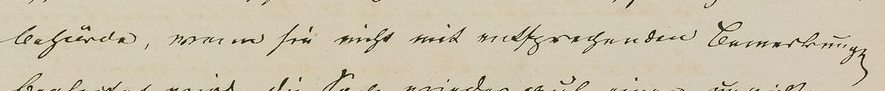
behörde, wenn sie nicht mit entsprechenden Bemerkungen
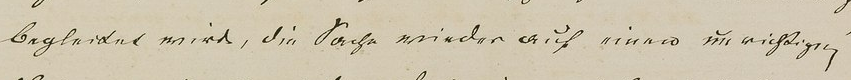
begleitet wird, die Sache wieder auf einen unrichtigen
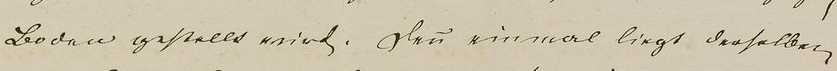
Boden gestellt wird. Denn einmal liegt derselben
